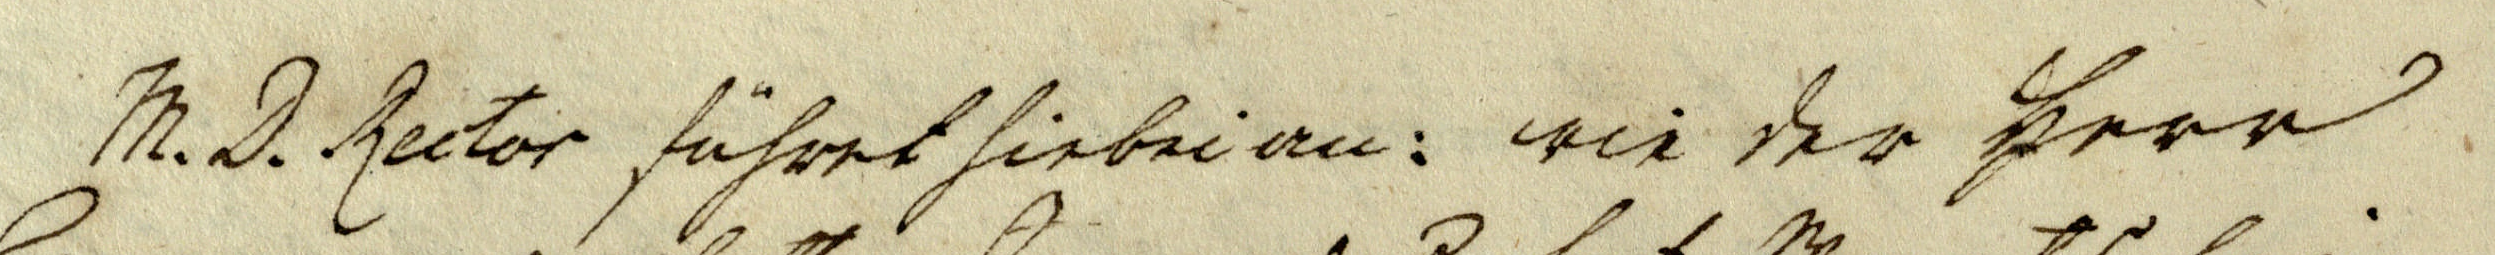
M. D. Rector führet hiebei an: wie der Herr
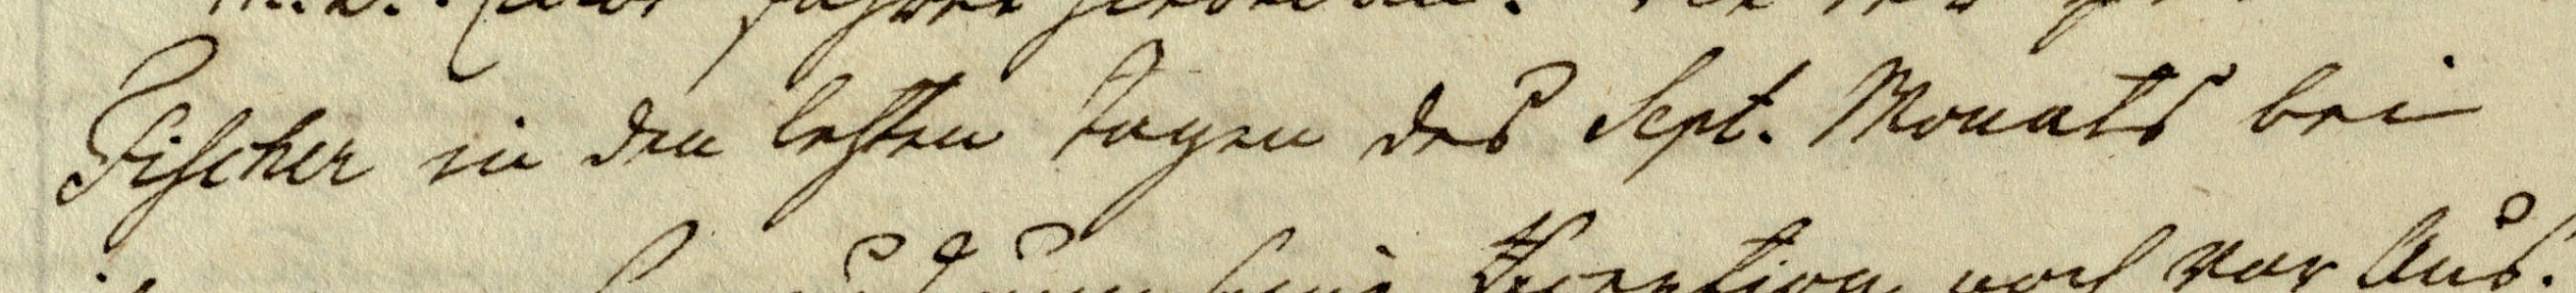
Fischer in den letzten Tagen des Sept. Monats bei
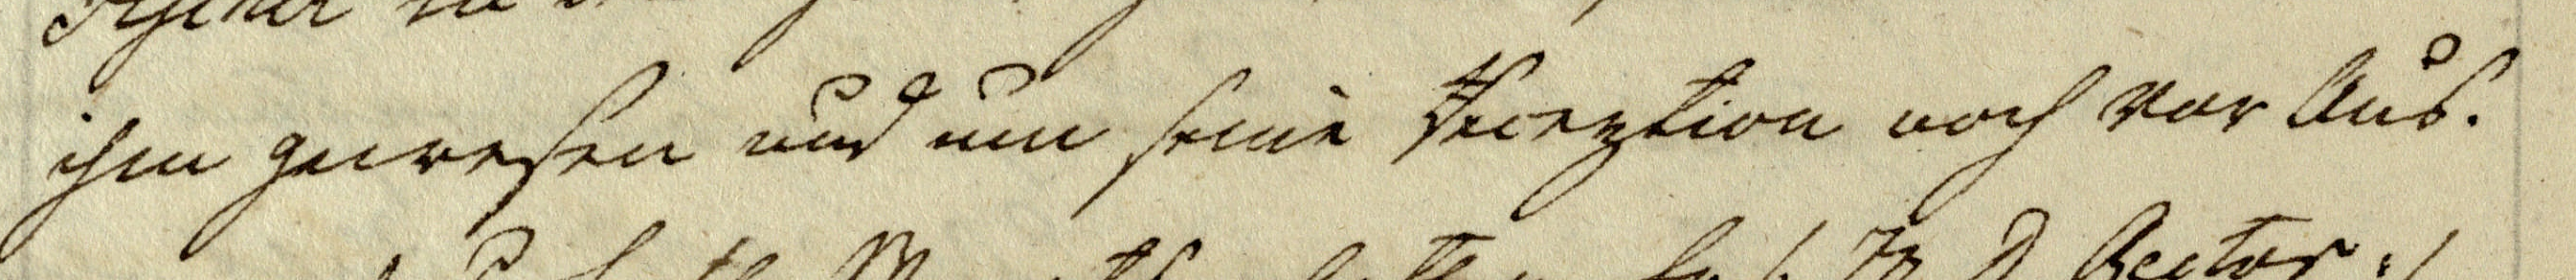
ihm gewesen und um seine Reception noch vor Aus¬
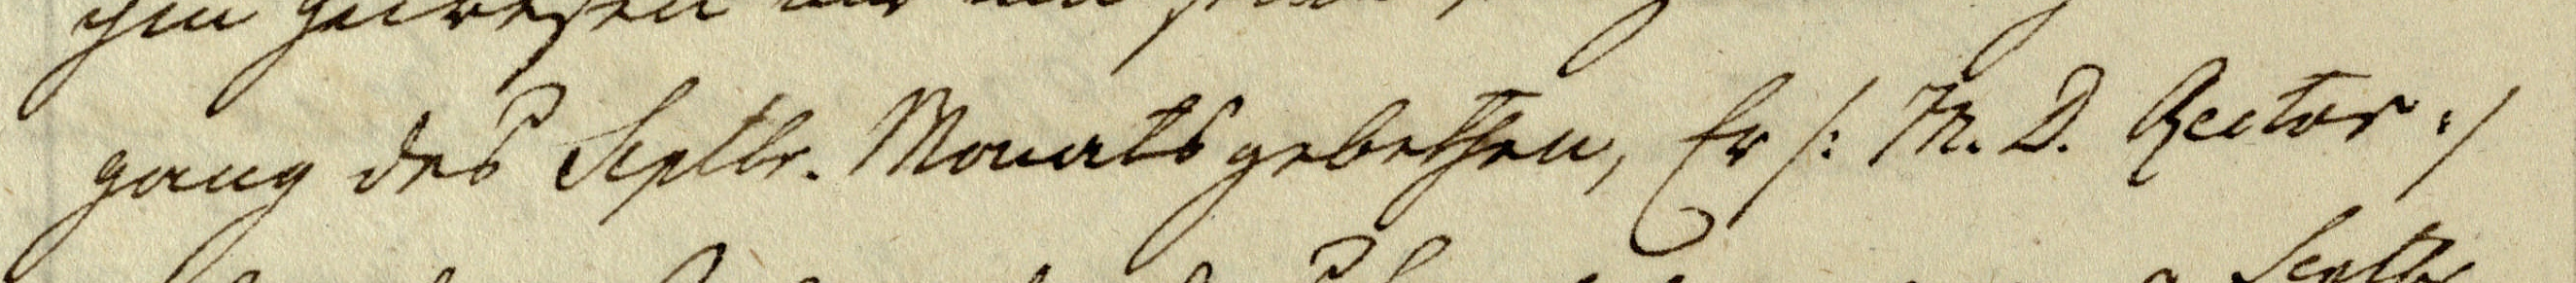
gang des Septbr. Monats gebethen, Er /. M. D. Rector :/
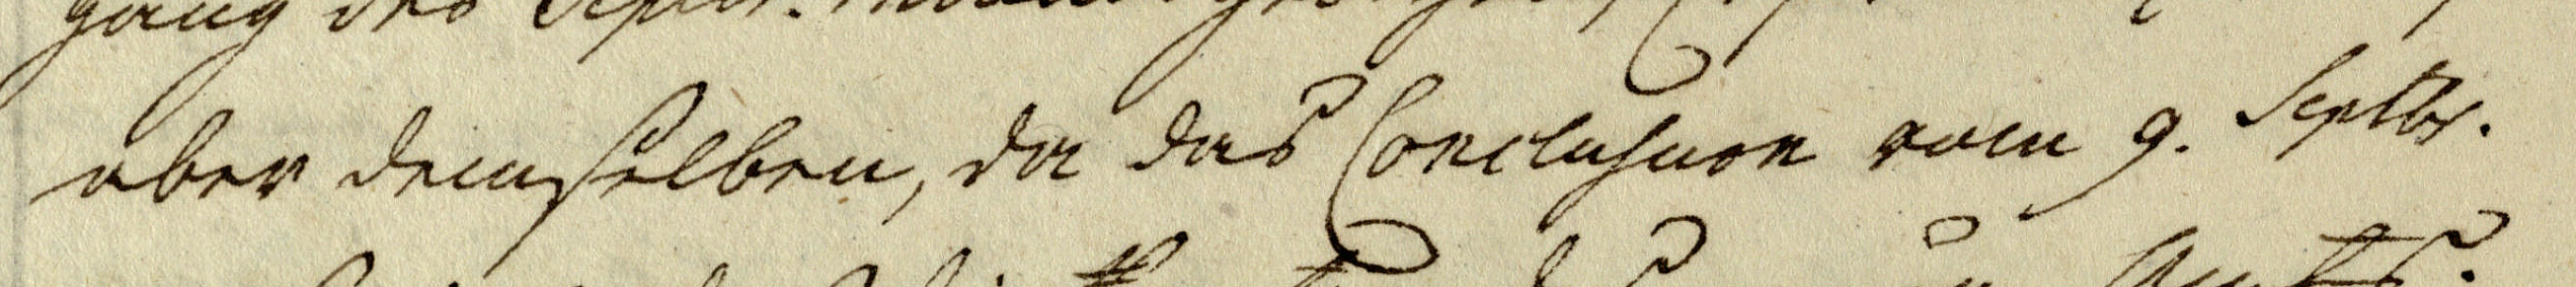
aber demselben, da das Conclusum vom 9. Septbr.
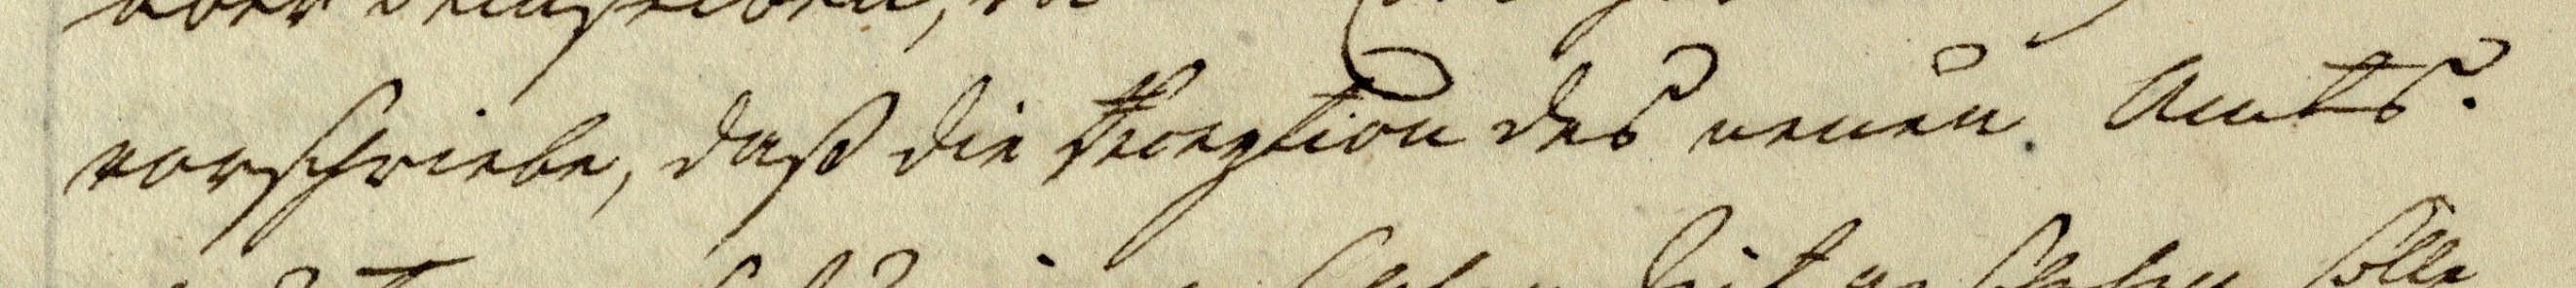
vorschriebe, daß die Reception des neuen. Amts¬
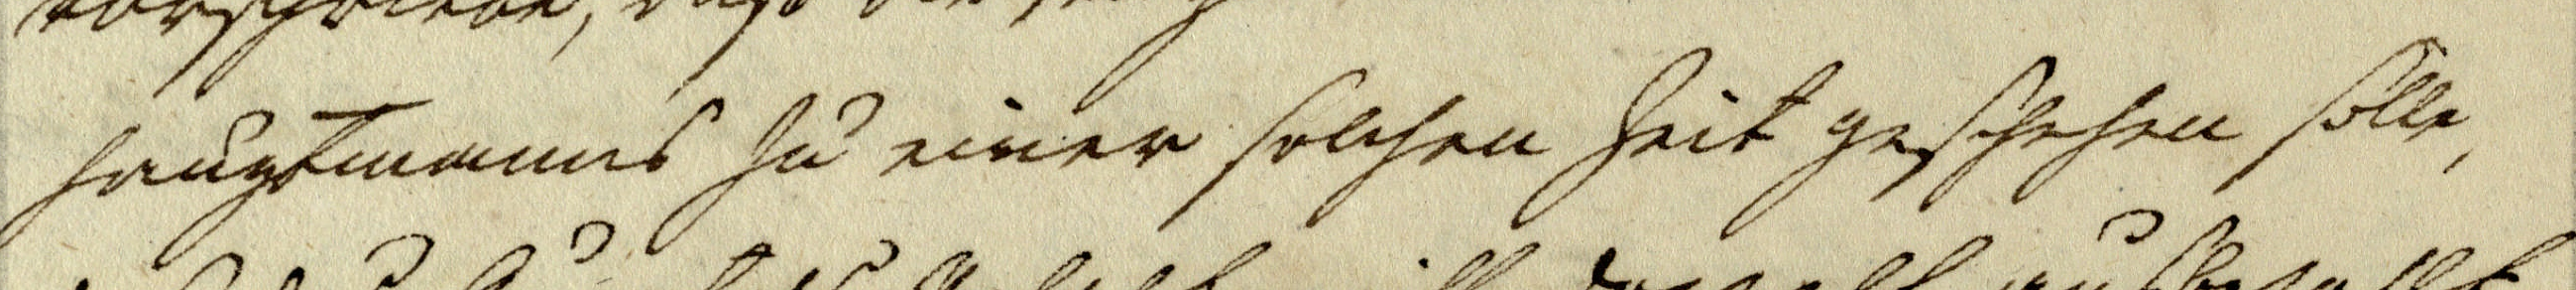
hauptmanns zu einer solchen Zeit geschehen solle,
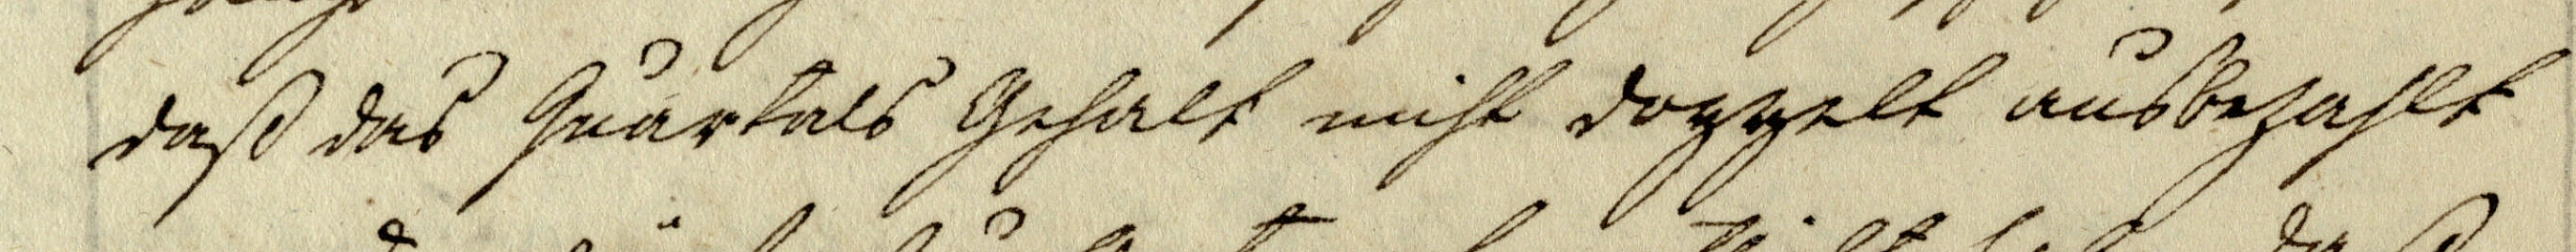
daß das Quartals Gehalt nicht doppelt ausbezahlt
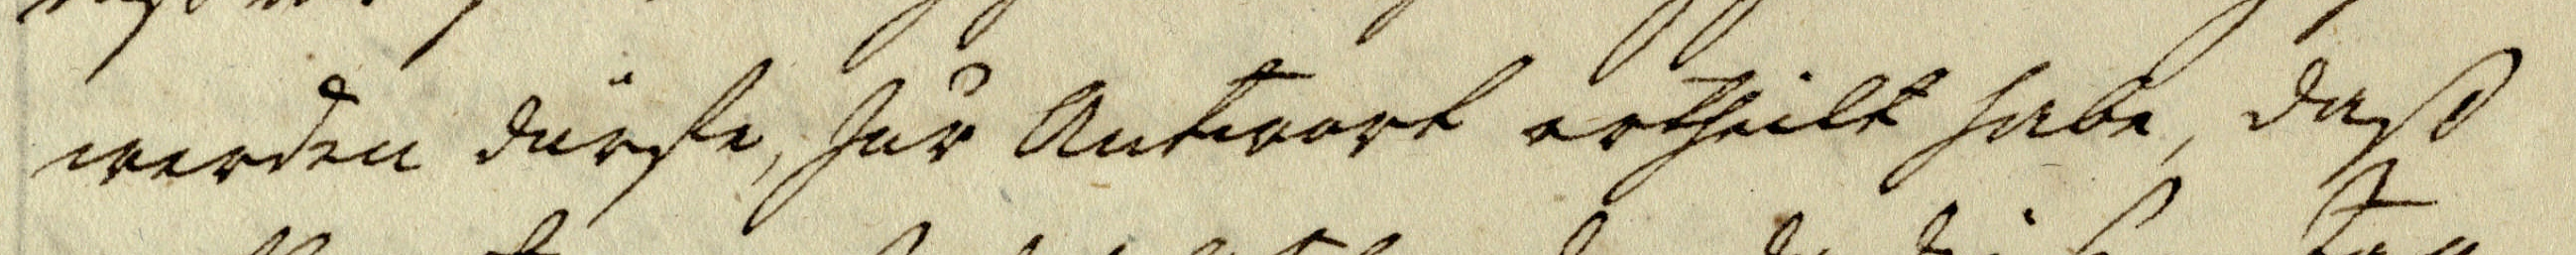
werden dürfe, zur Antwort ertheilt habe, daß
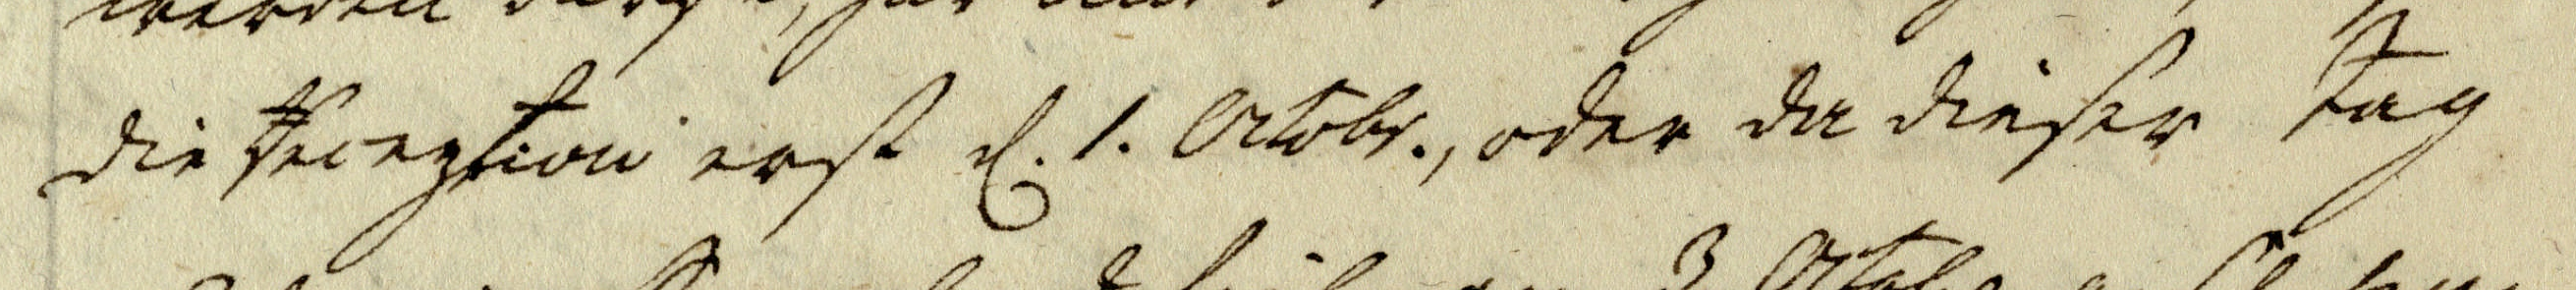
die Reception erst d. 1. Octbr., oder da dieser Tag
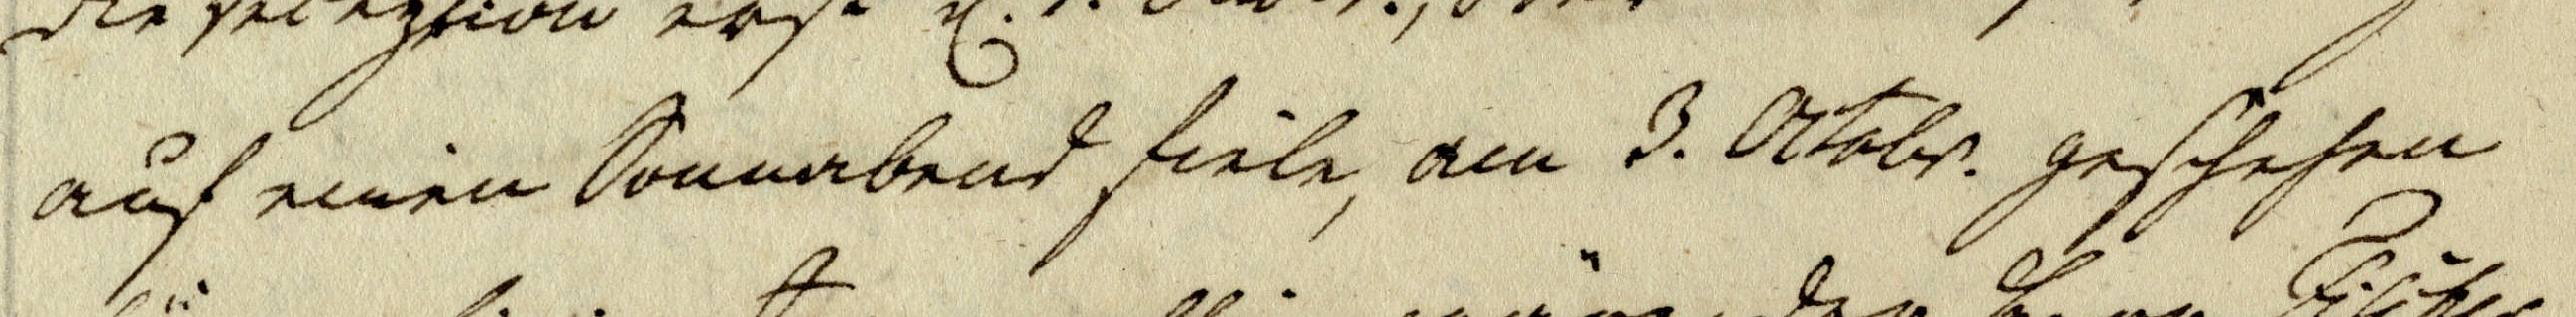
auf einen Sonnabend fiele, am 3. Octobr. geschehen
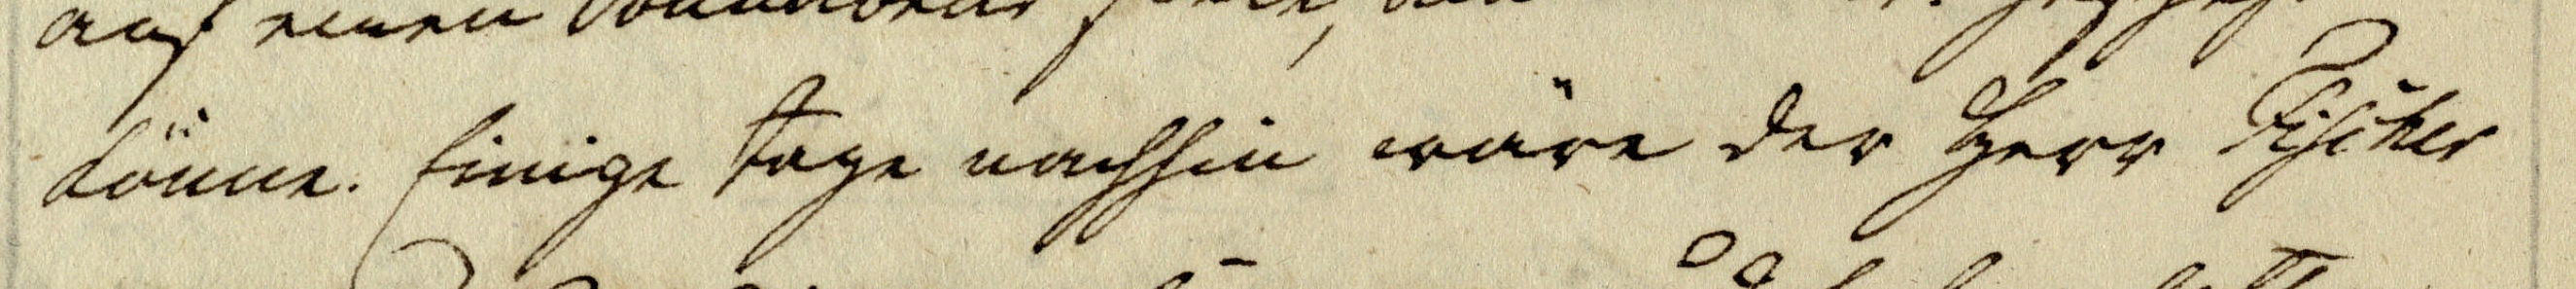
könne. Einge Tage nachhin wäre der Herr Fischer
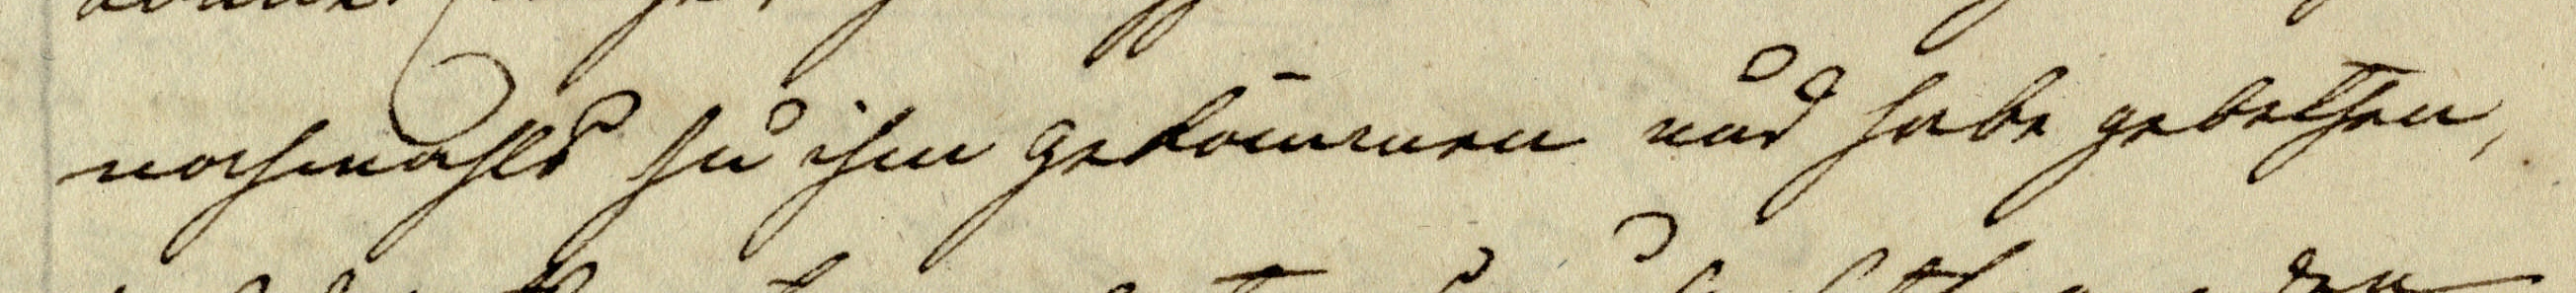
nochmahls zu ihm gekommen und habe gebethen,
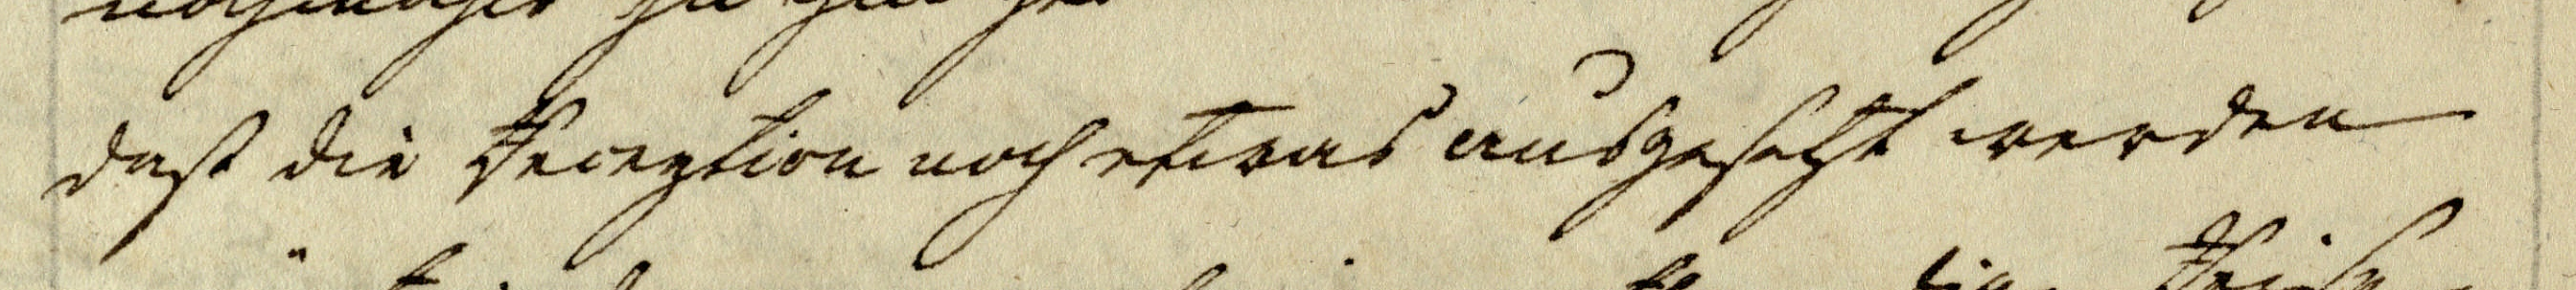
daß die Reception noch etwas ausgesetzt werden
